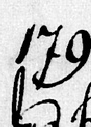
f¬
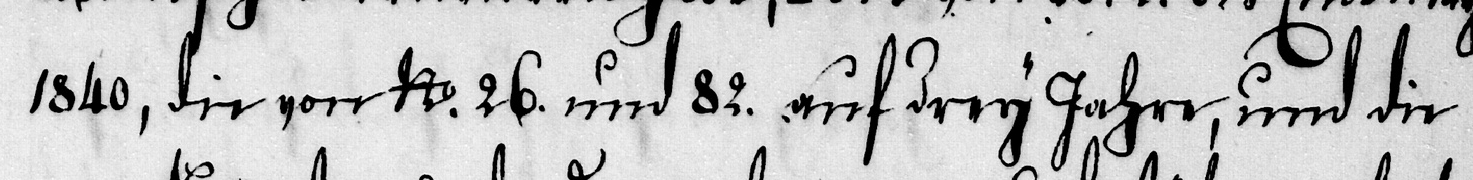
1840, die von No. 26. und 82. auf drey Jahre, und die
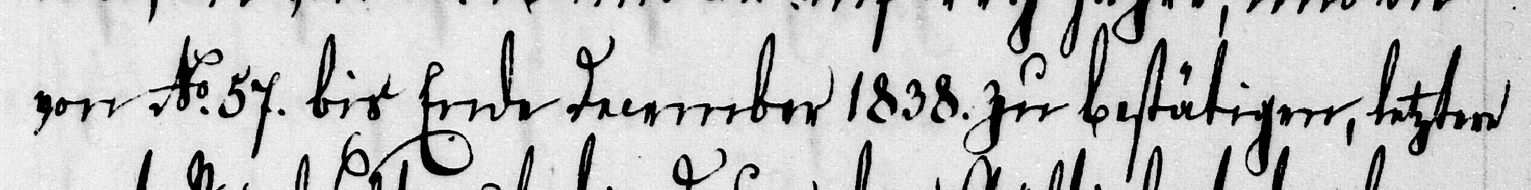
von No. 57. bis Ende December 1838. zu bestätigen, letztere
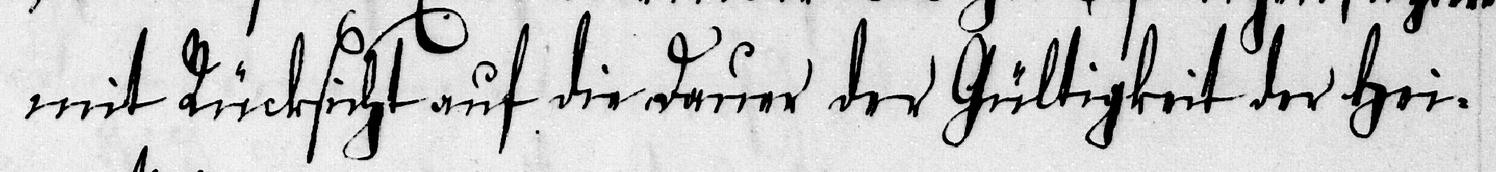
mit Rücksicht auf die Dauer der Gültigkeit der Hei¬
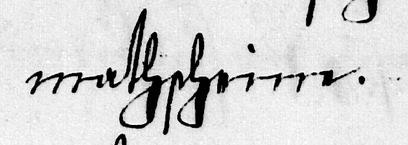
mathscheine.
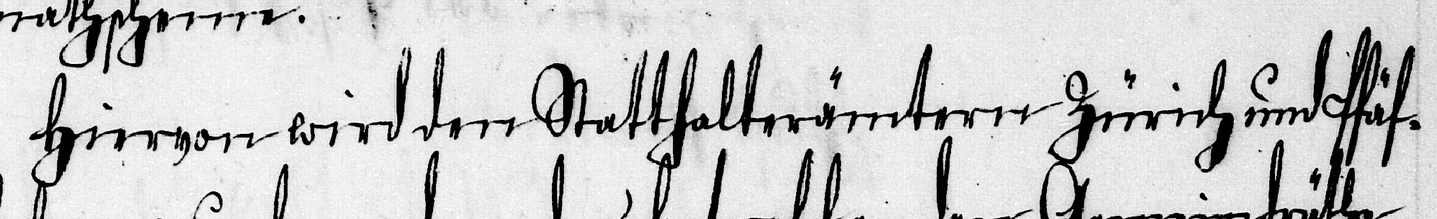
Hiervon wird den Statthalterämtern Zürich und Päf¬
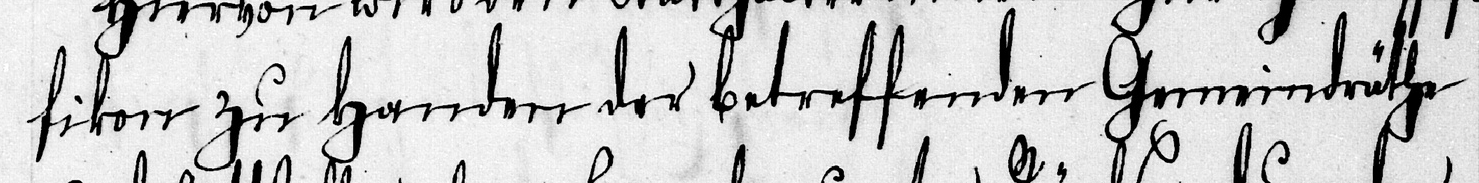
fikon zu Handen der betreffenden Gemeindräthe
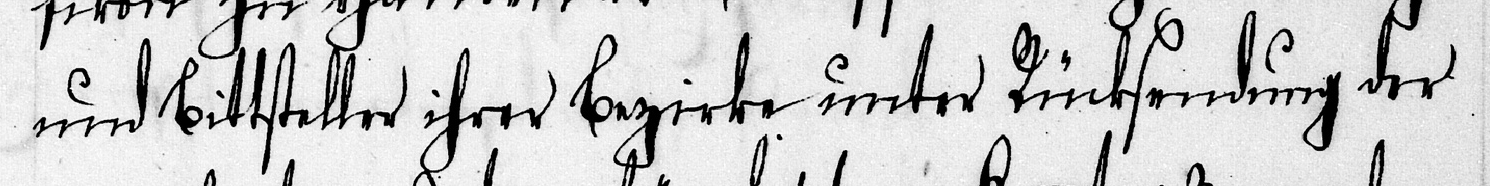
und Bittsteller ihrer Bezirke unter Rücksendung der
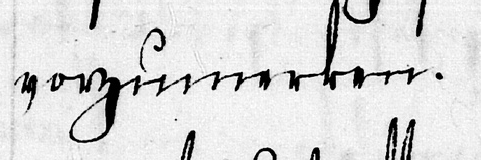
vorzumerken.
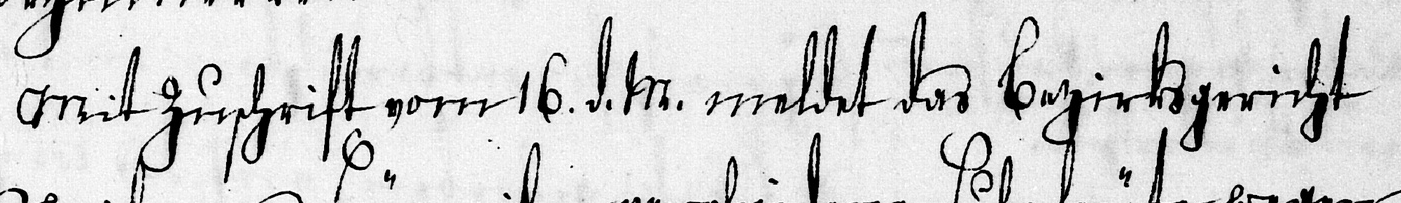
Mit Zuschrift vom 16. d. M. meldet das Bezirksgericht
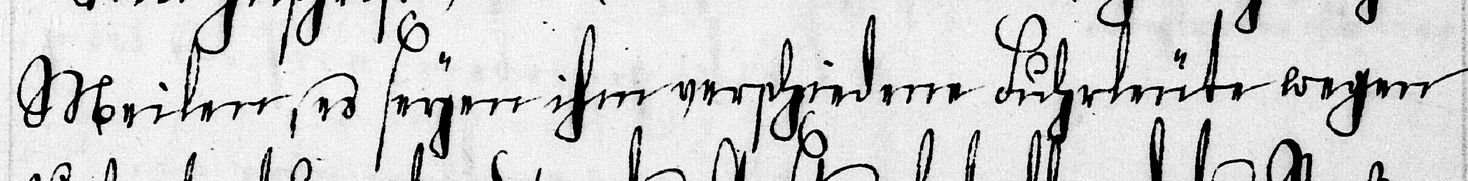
Meilen, es seyen ihm verschiedene Fuhrleute wegen
